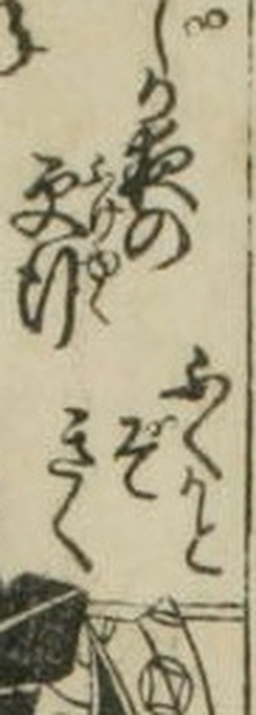更行きく
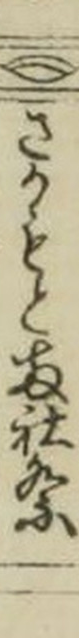さかもと両社祭
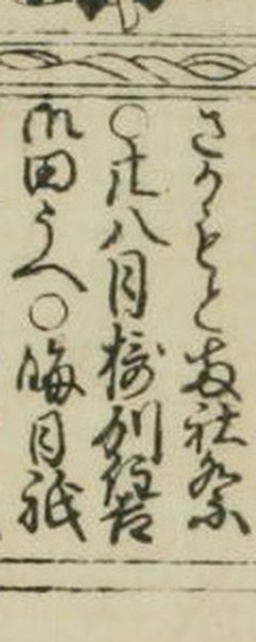○廿八日摂州住吉
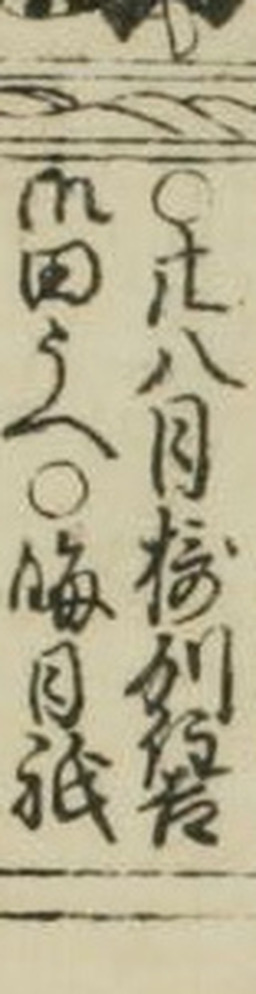御田うへ○晦日祇
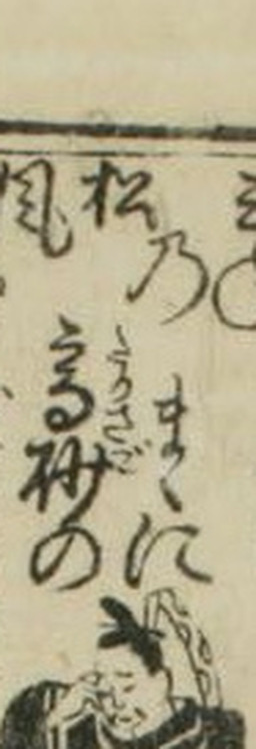松高砂の
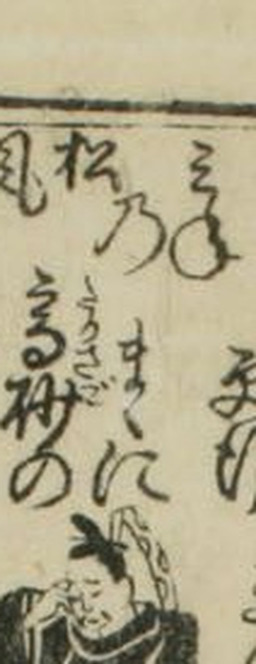松高砂の
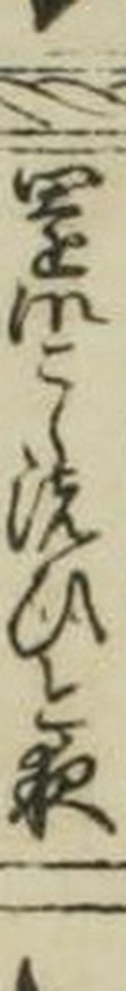園御こし洗ひと夜
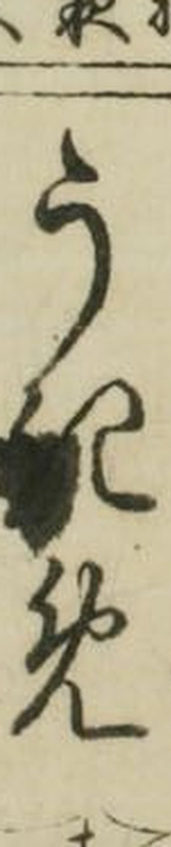うきめ
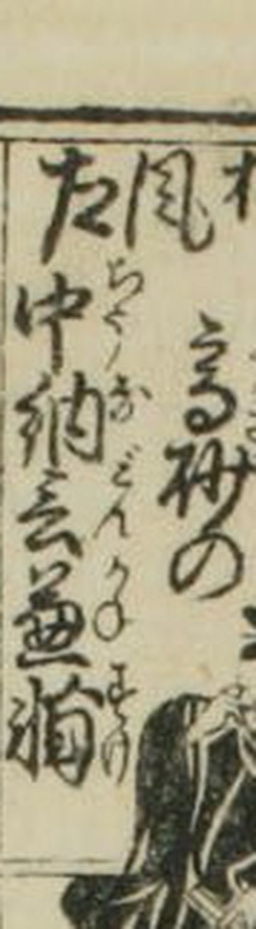左中納言兼輔
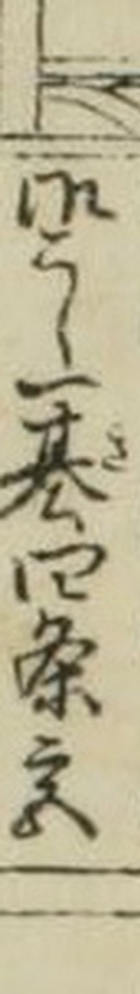御こし一基四条宮
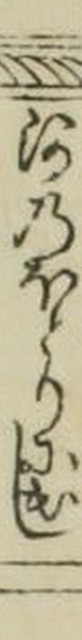河のほとりに出し
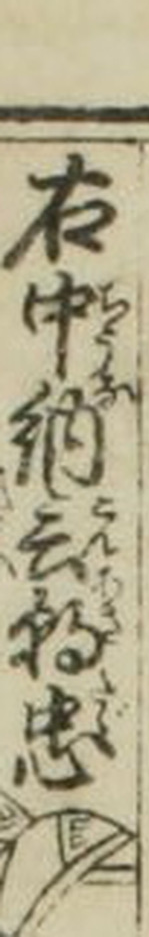右中納言朝忠
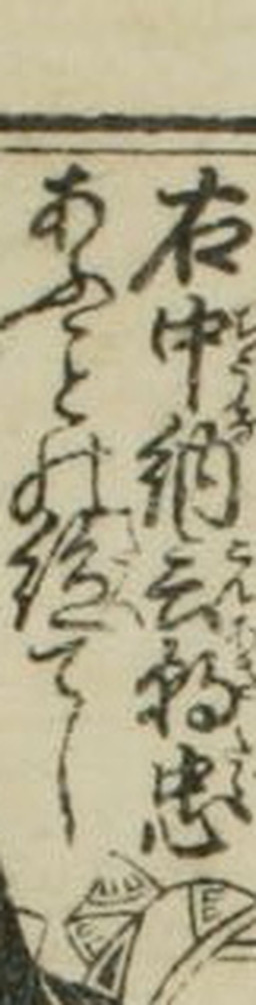あふことの絶てし
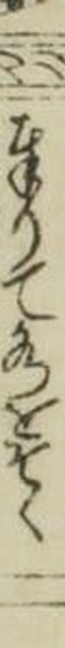奉りて水をそゝ
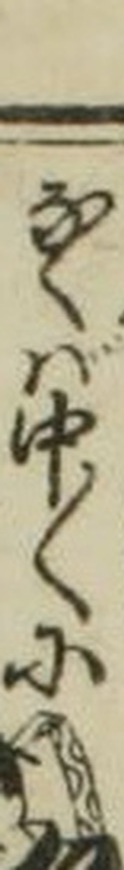なくば中〳〵に
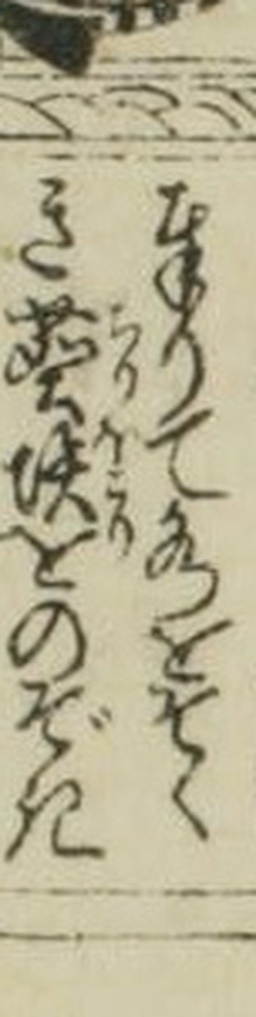き塵埃をのぞき
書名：女源氏教訓鑑
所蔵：東京学芸大学附属図書館
